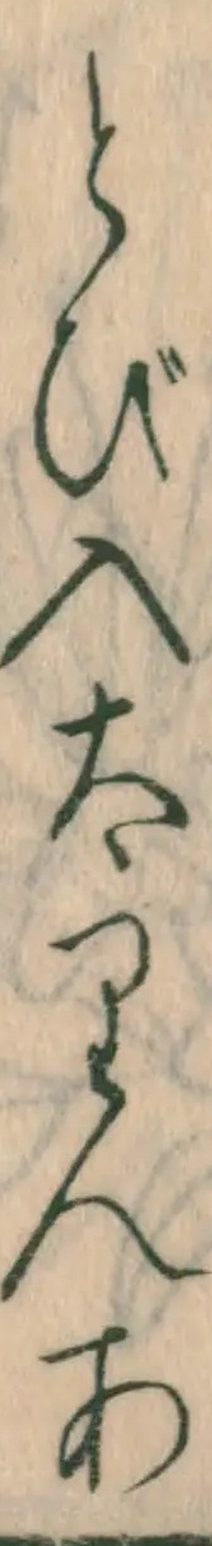とび入太りんあ
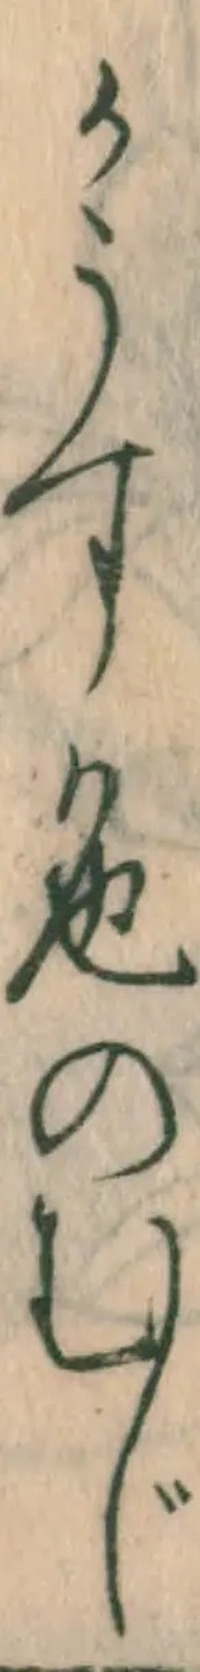かうす色のむじ
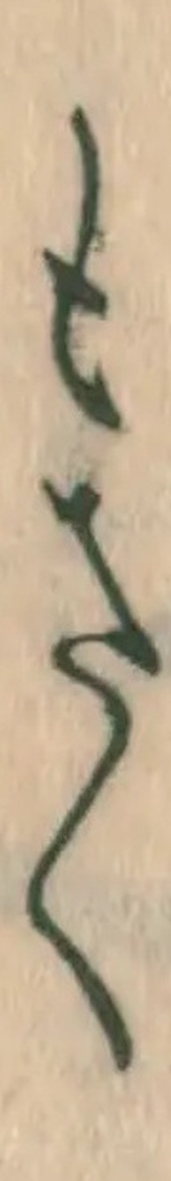もさく
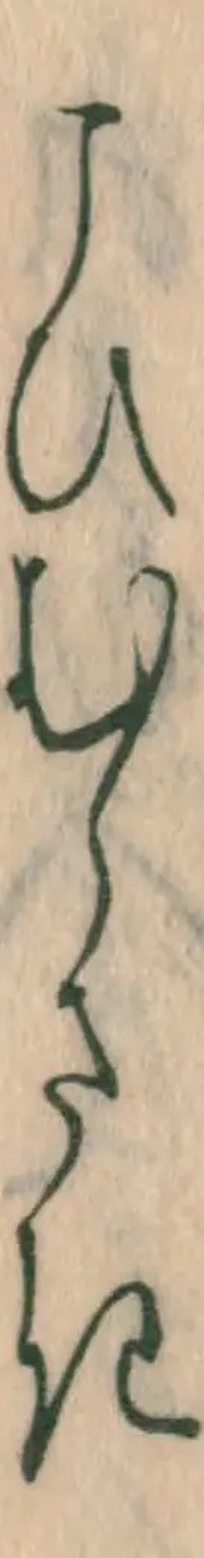こひむらさき
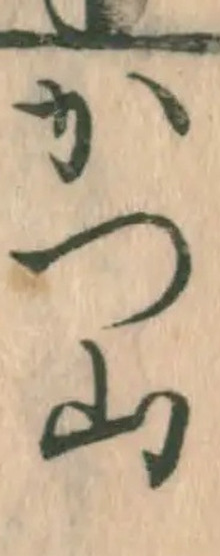かつ山
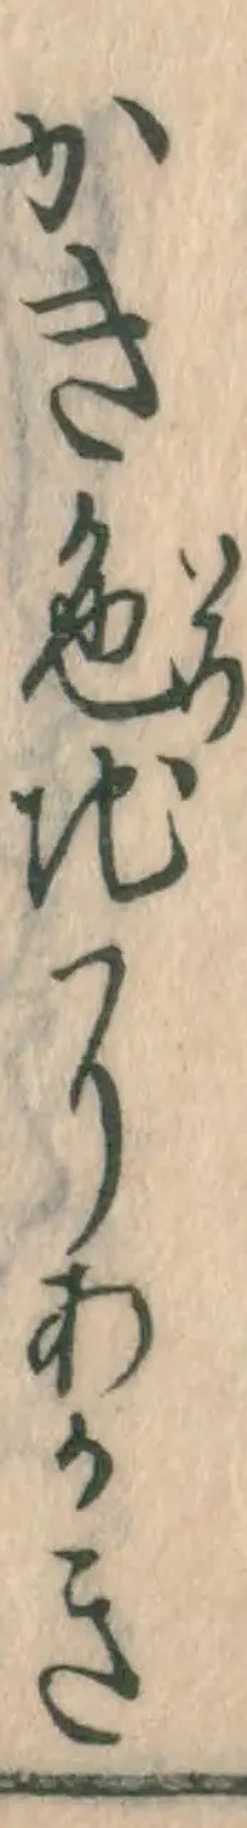かき色地にあかき
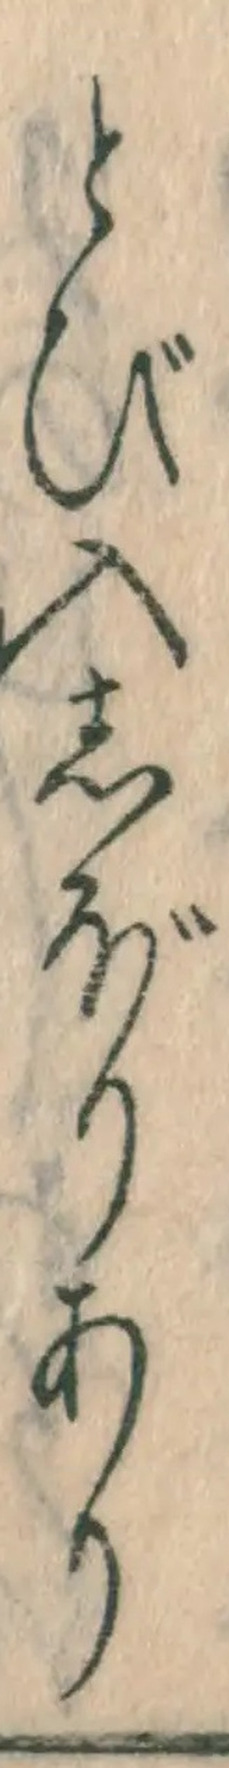とび入しぼりあり
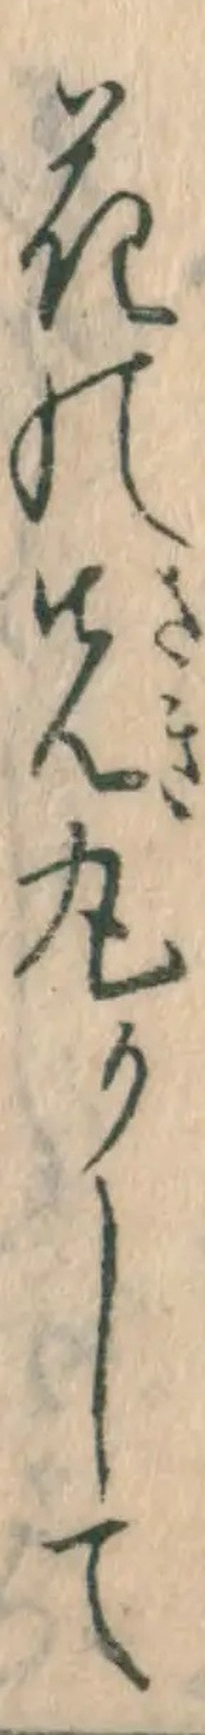花の先丸くして

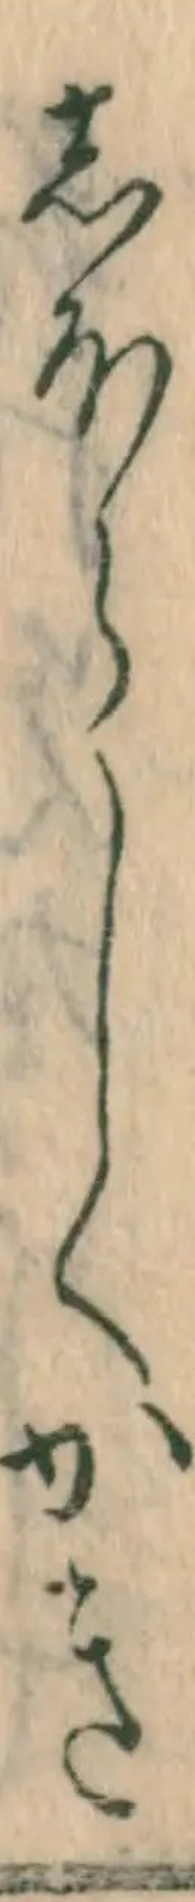しほらしくかき
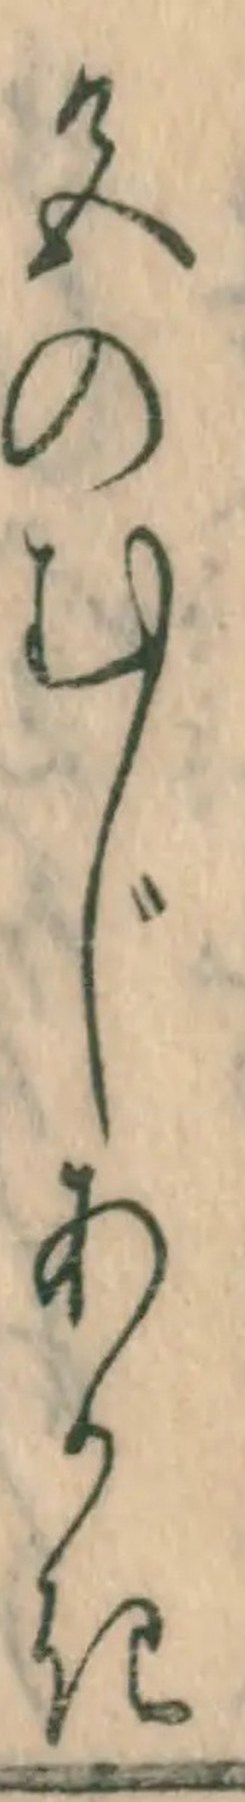色のむじあかき
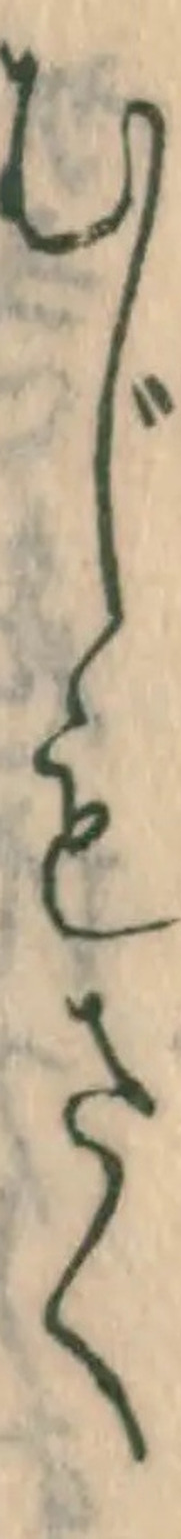むじもさく
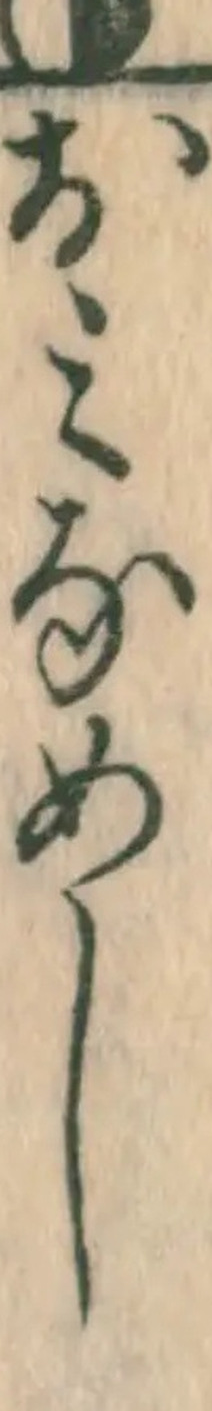おみなめし
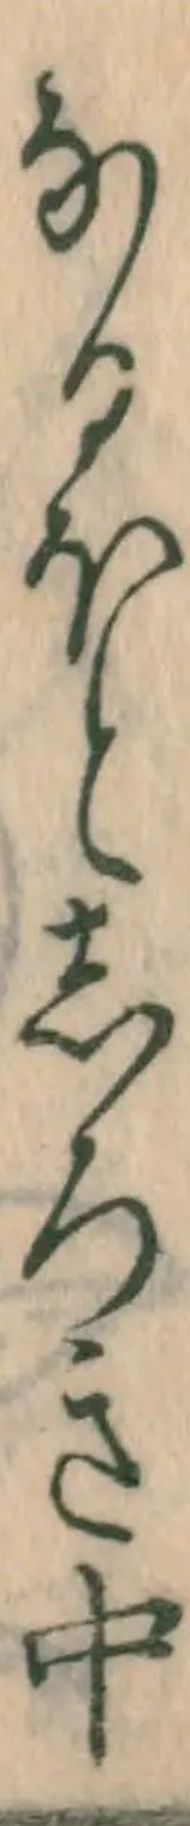なるほとしろき中
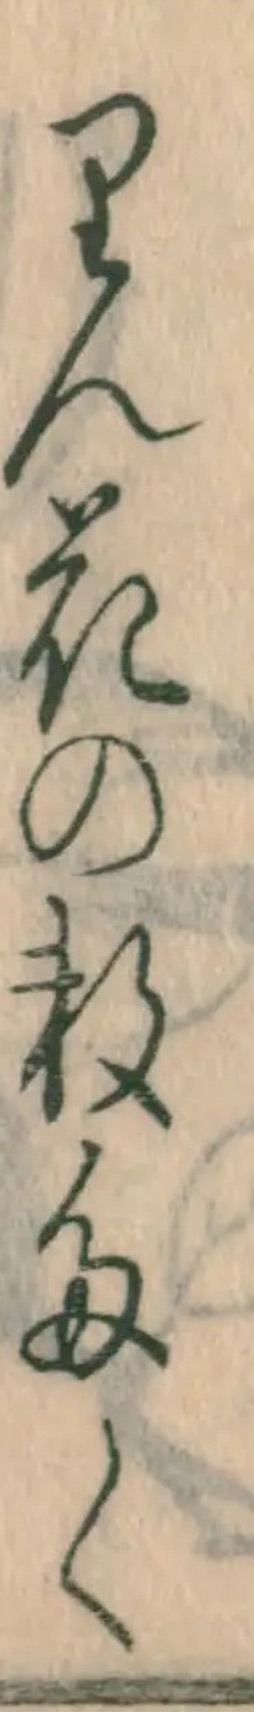りん花の数多く
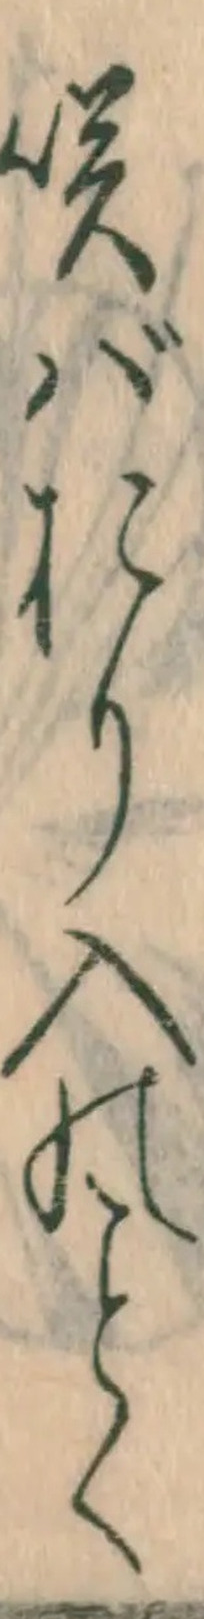咲ばおり入のことく
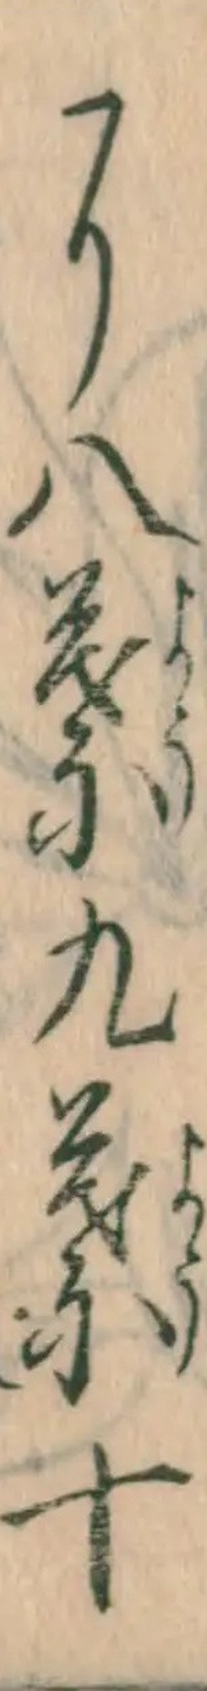に八葉九葉十
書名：錦繍枕 5巻. [4]
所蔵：国立国会図書館 National Diet Library, JAPAN
